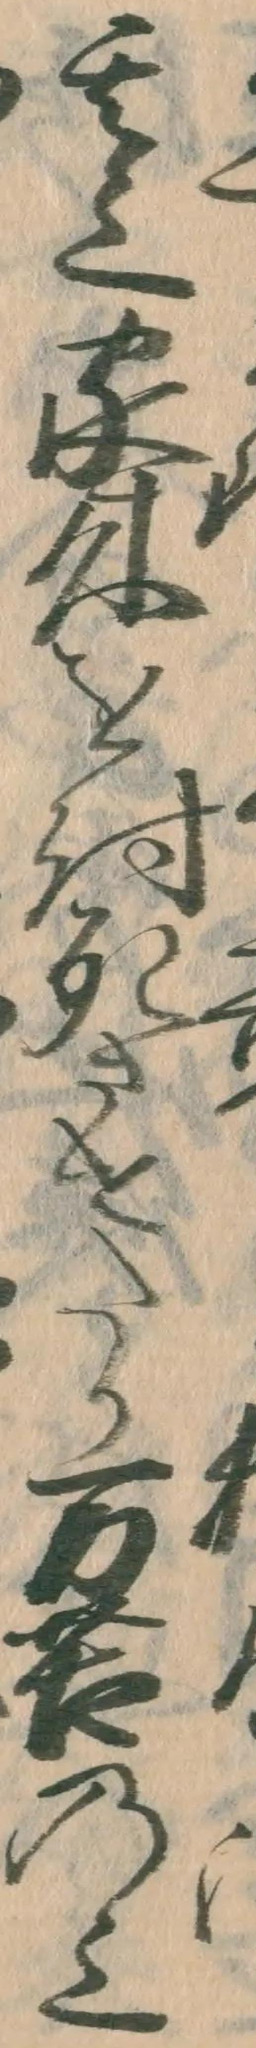其上家来を討死させたり万苦の上
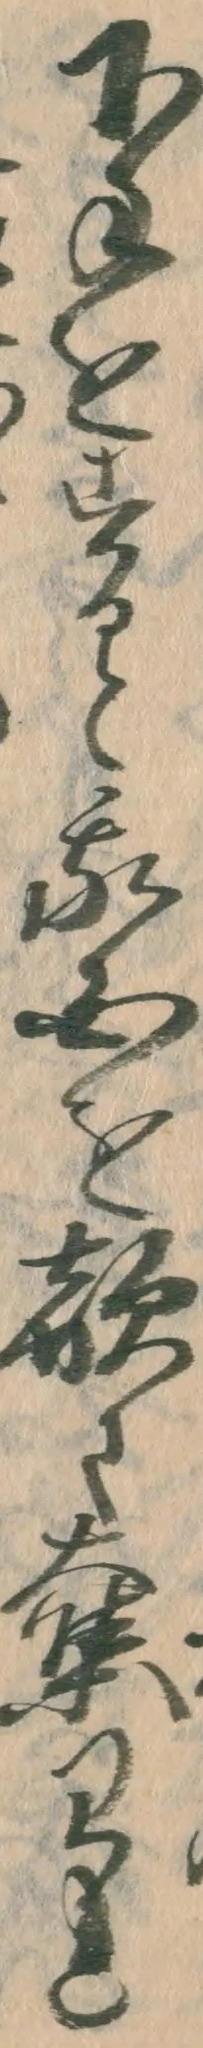下手をすると我国を敵に奪われ
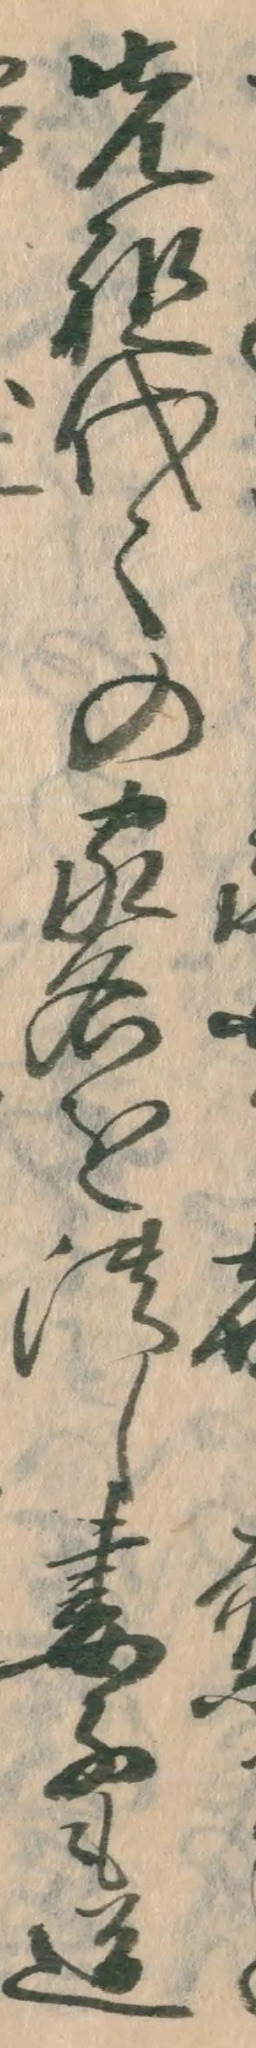先祖代々の家名を潰し妻子も道
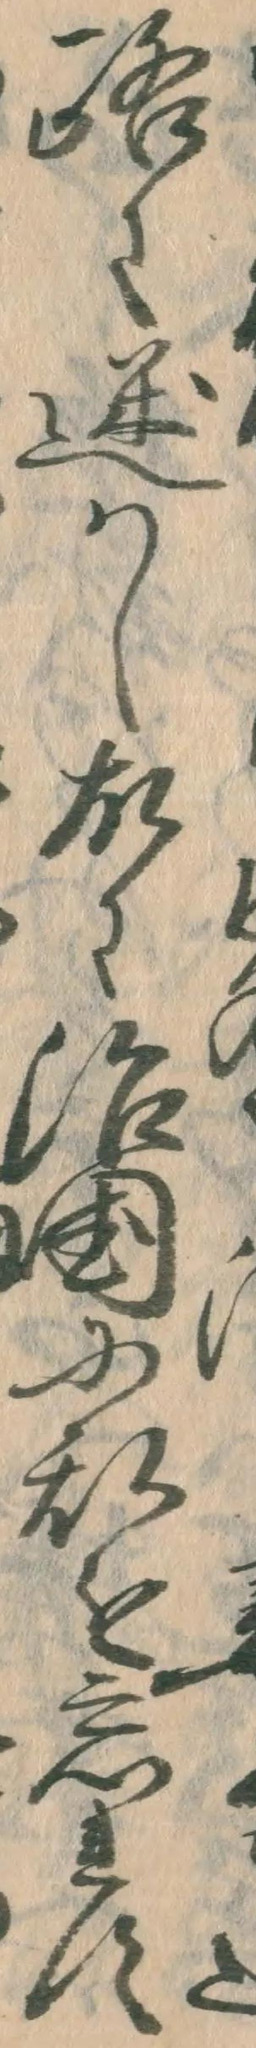路に迷ハし故に治国に乱を忘れす
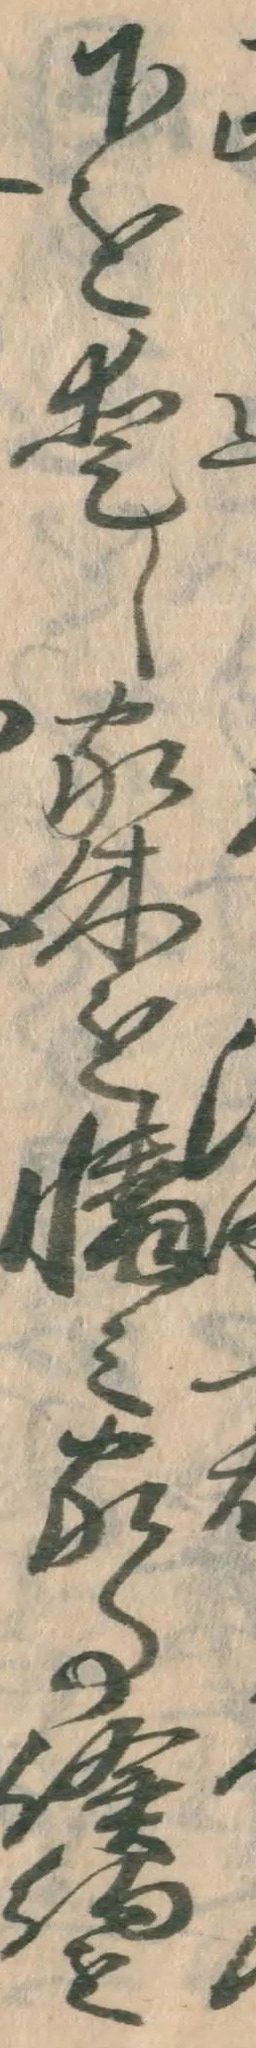下を愛し家来を憐ミ家事倹約を
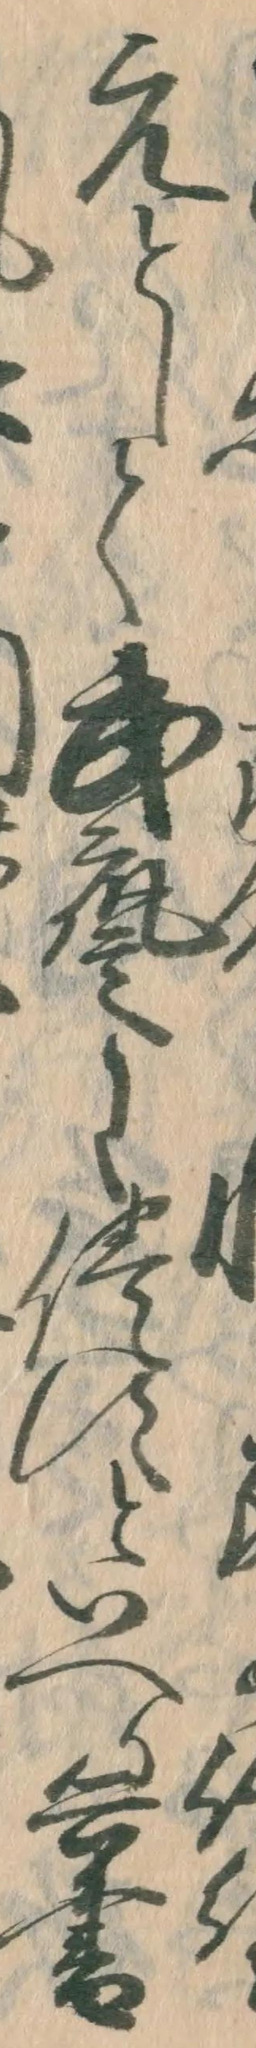元として武藝に儘すといへり兵書
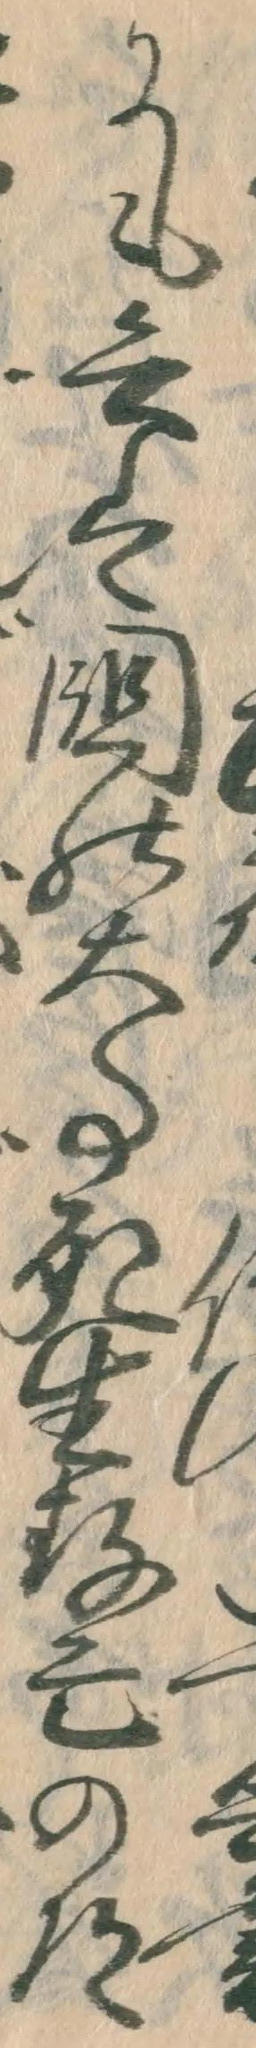にも兵は国の大事死生存亡の道
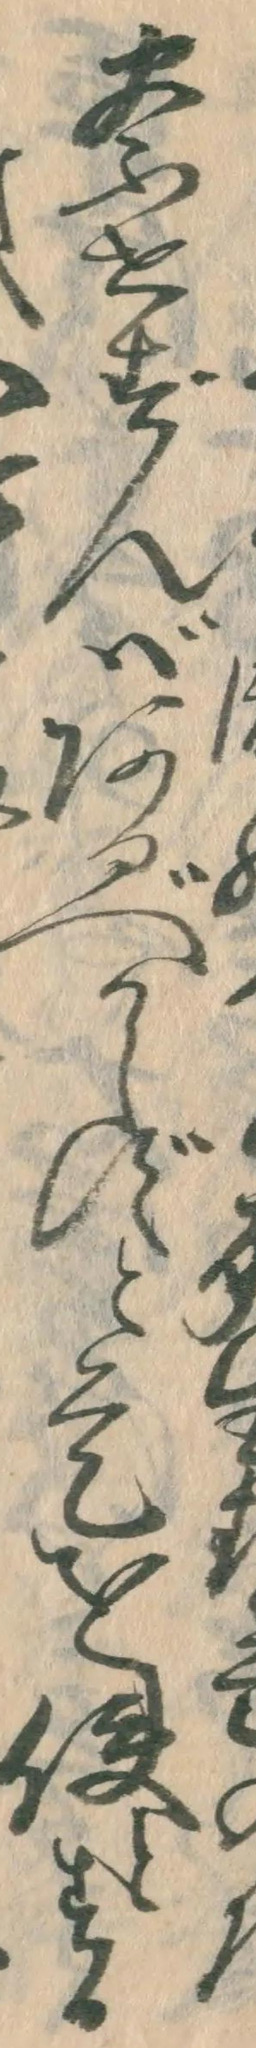察せずんバあるべからずと是を使とする
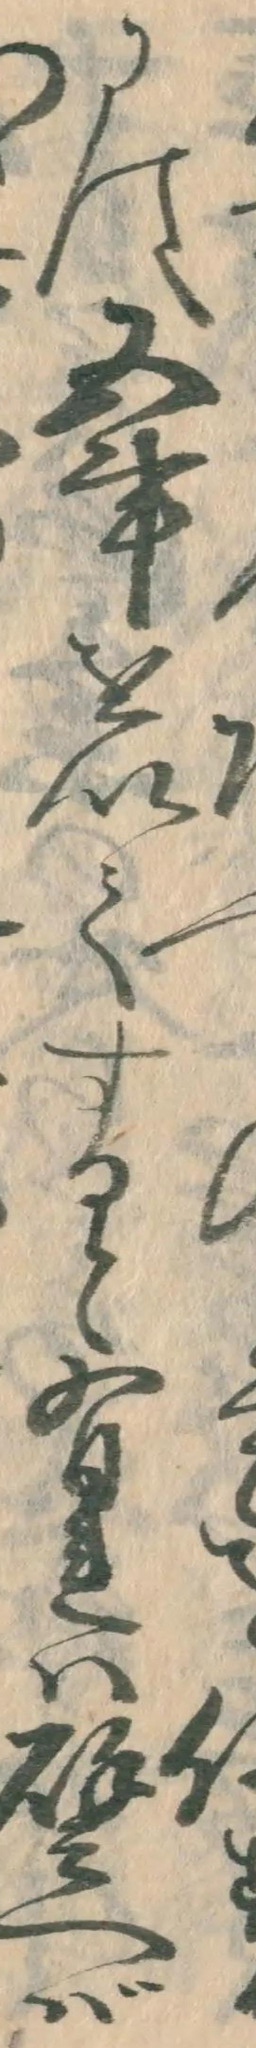には五事を以てすると有れハ譬へバ
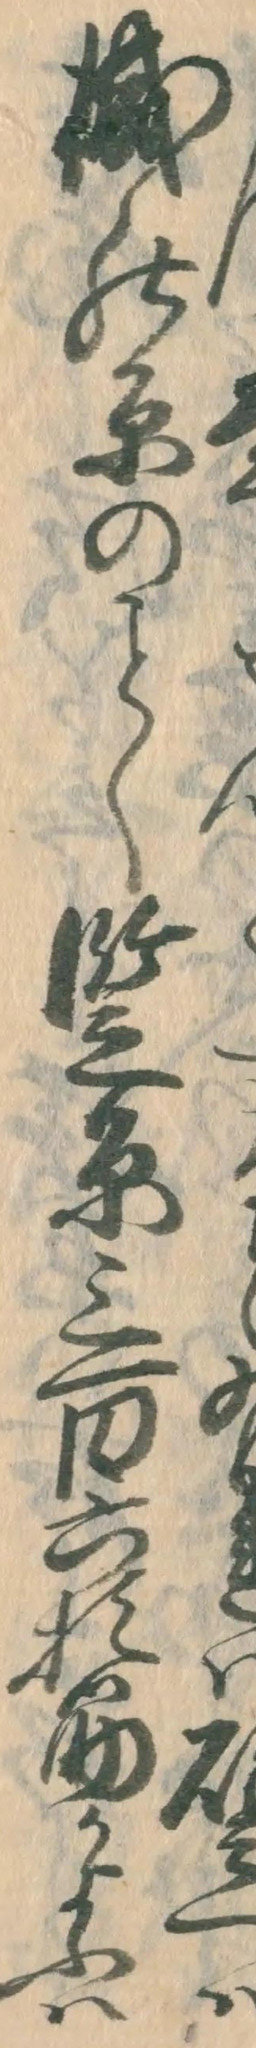機の糸のことく竪糸三百六拾筋かよふハ

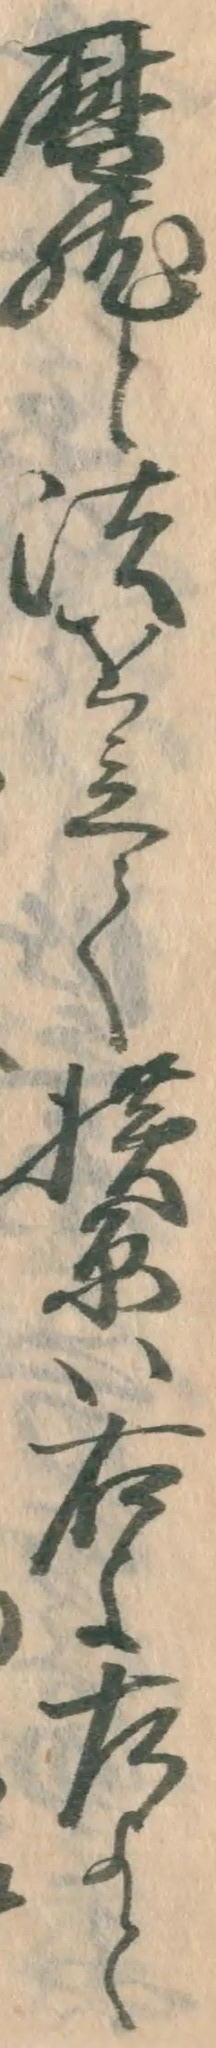暦然と法を立て横糸ハ右よ左よと
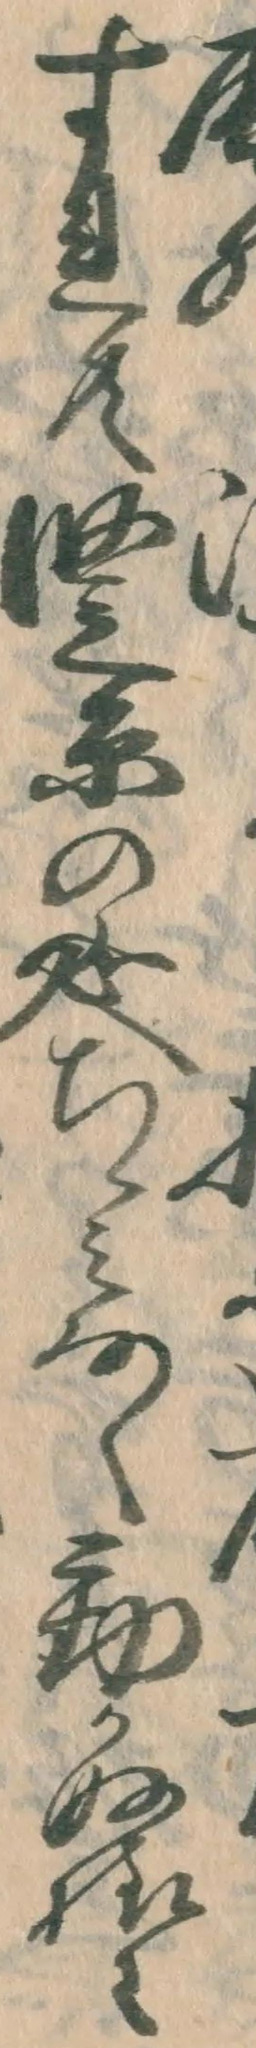すれ共竪糸の延ちゝミなく動かぬ様に
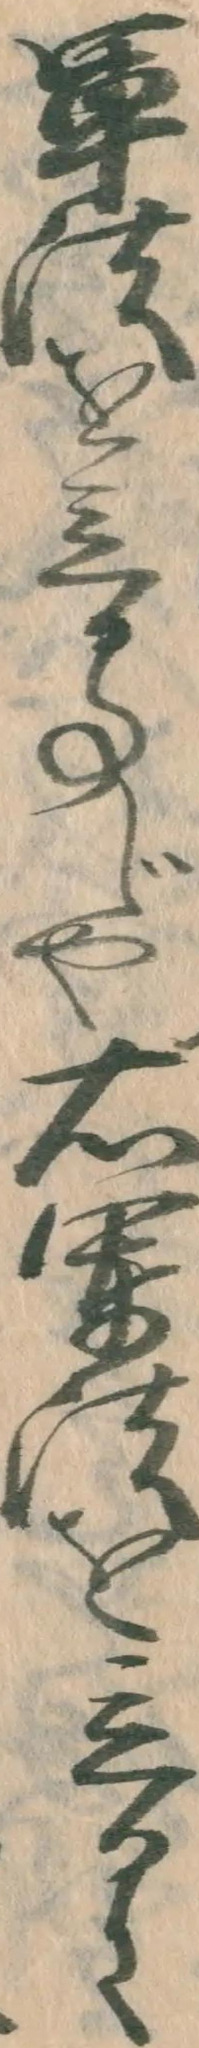軍法を立る事じや右軍法を立るに
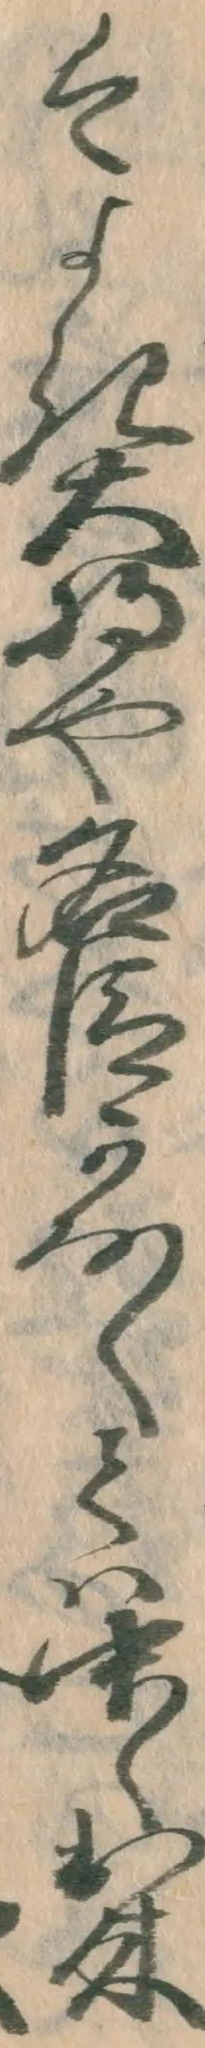はよき大将や名臣かなくてハ中々出来
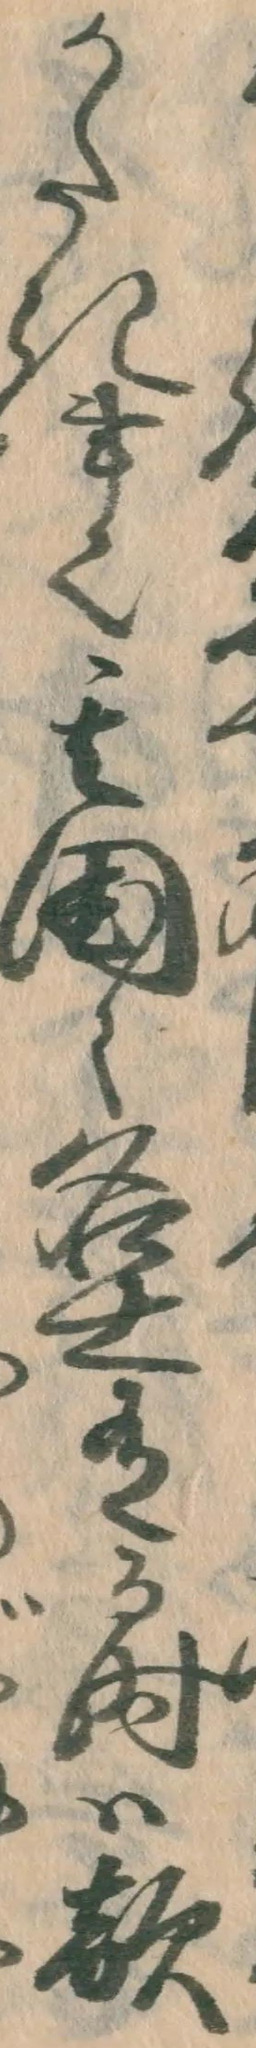かたき事也其国に名士有る時ハ敵
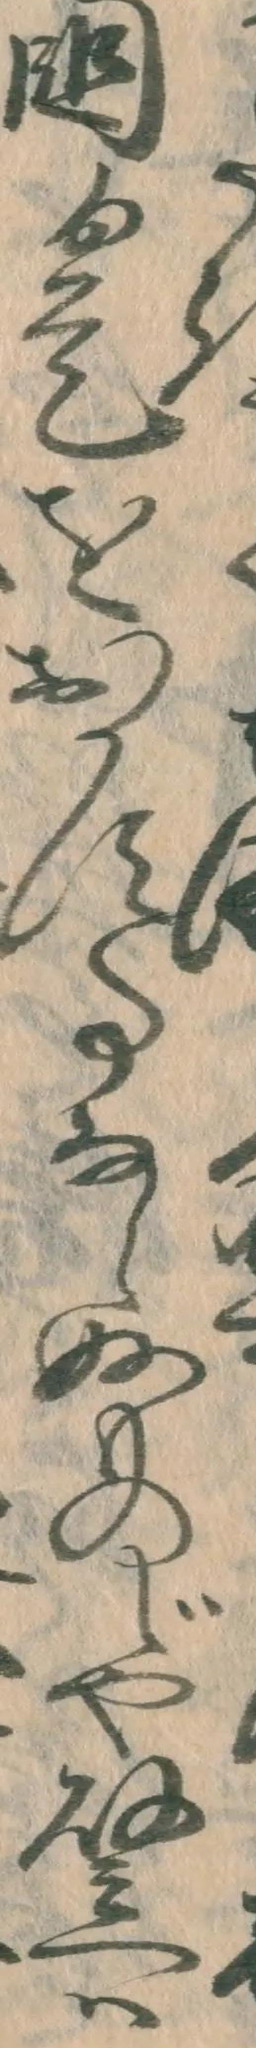国ゟ是をおかす事ならぬものじや譬へハ
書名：麗斎叢書. 20
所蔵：国立国会図書館 National Diet Library, JAPAN
